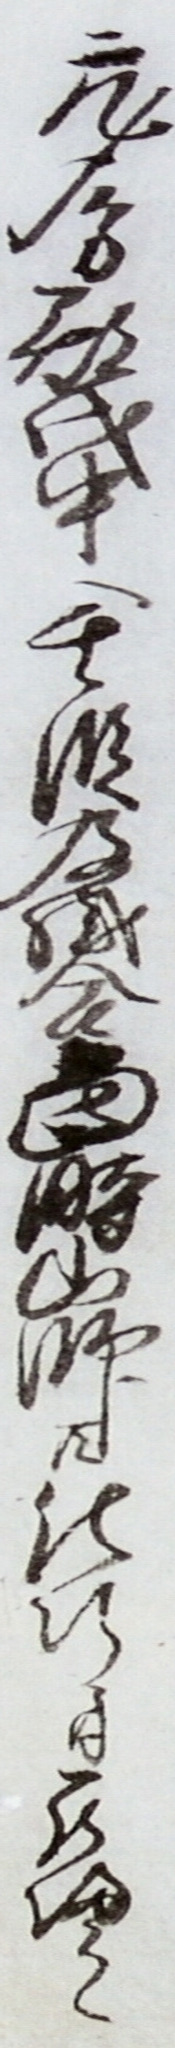元〆方郡代中へ其段及掛合当時山師共ニ付罷帰候
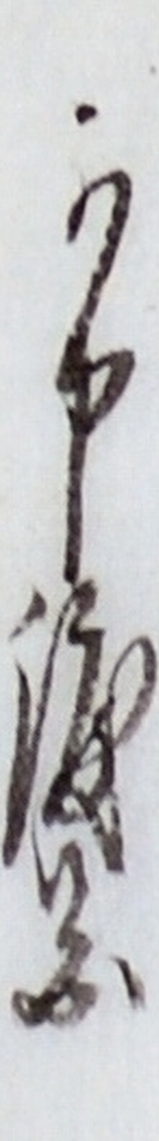可申渡図

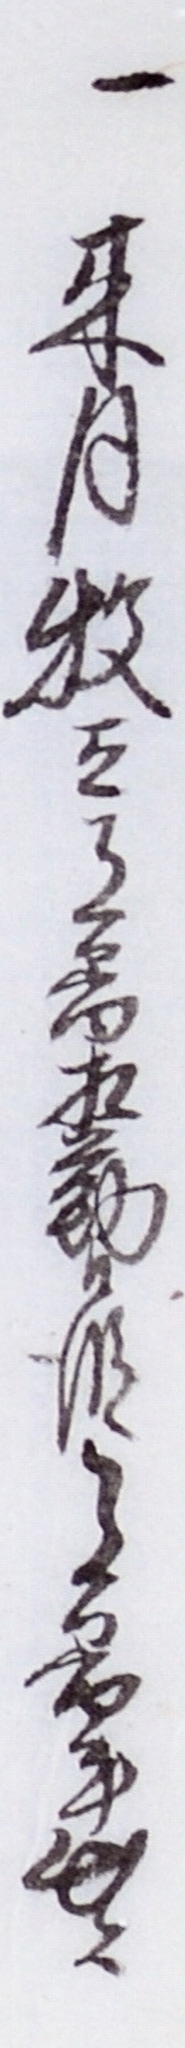一来月牧太之節相勤候段之書付出候
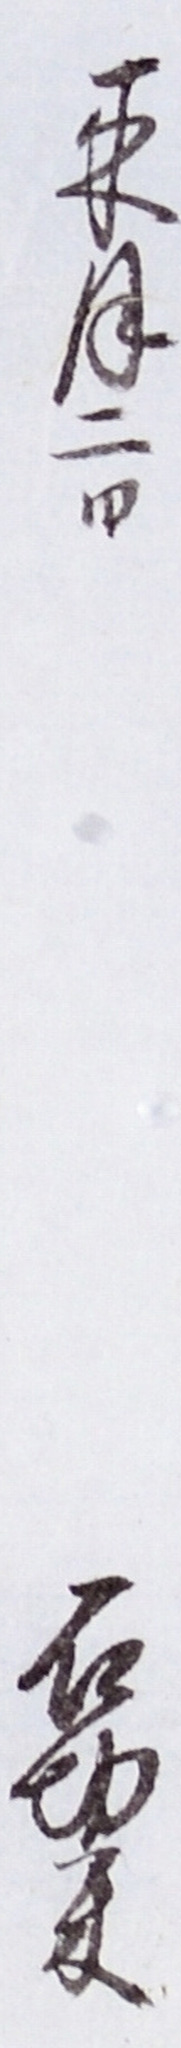来月二日石切米
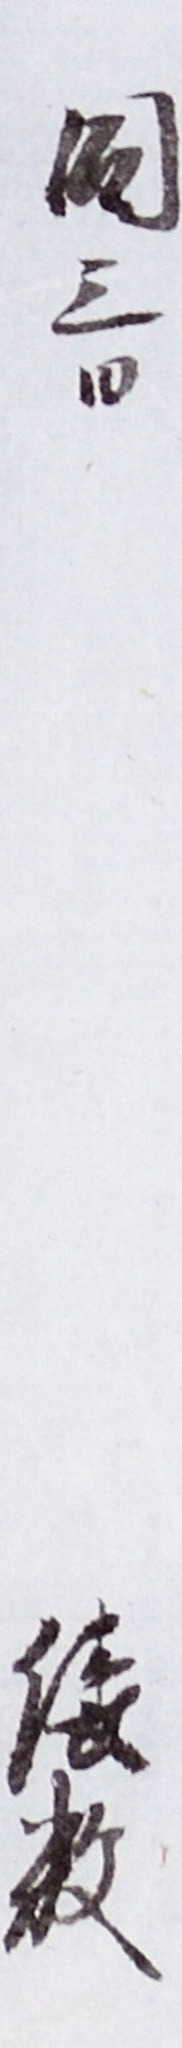同三日俵数
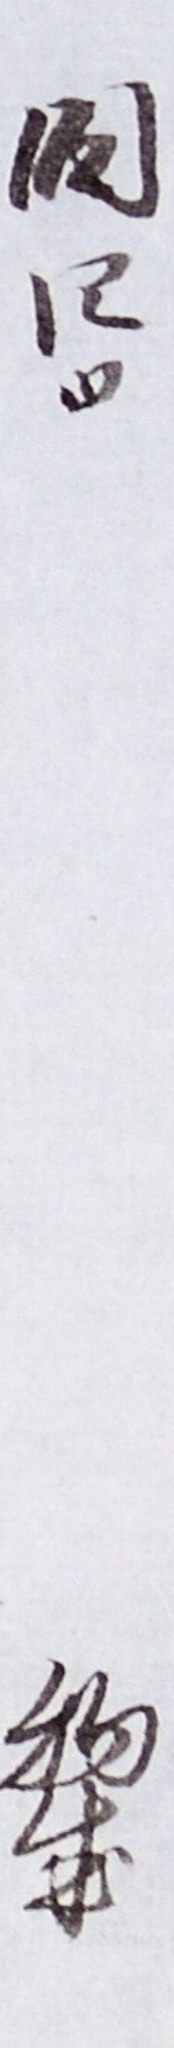同四日物成
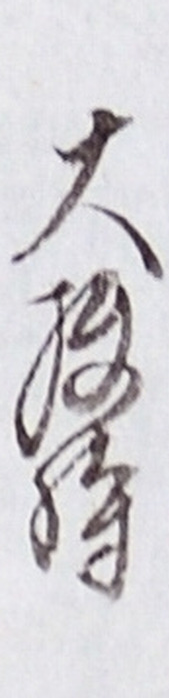大扶持
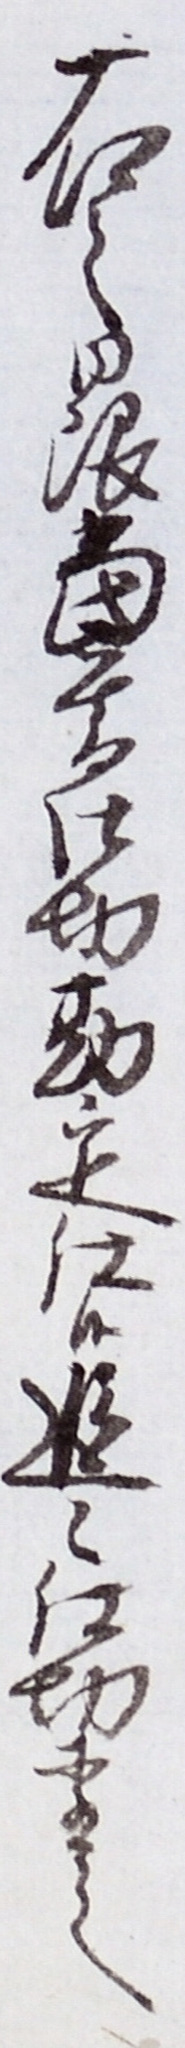右之日限当節仕切勘定仕候追々仕切有之
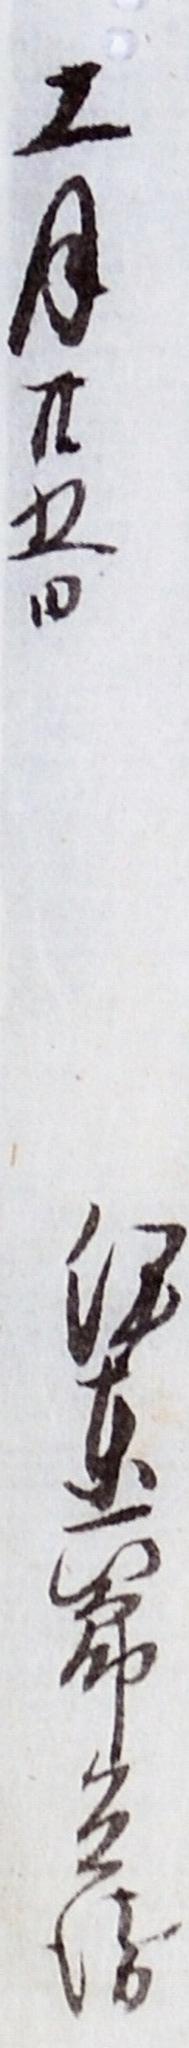十一月廿五日伊東六郎兵衛
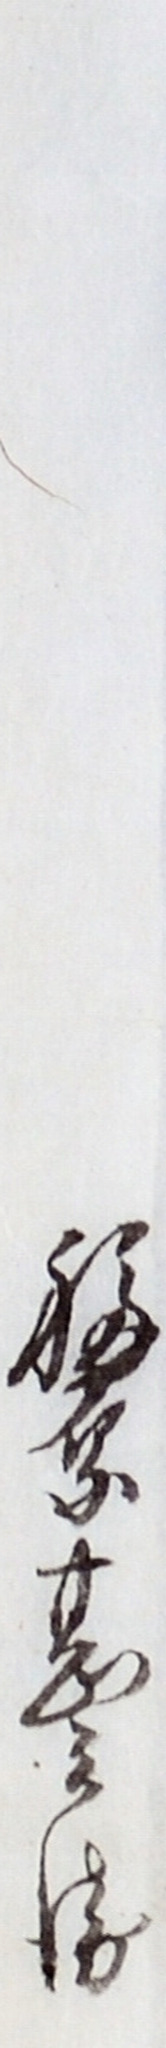福原甚兵衛
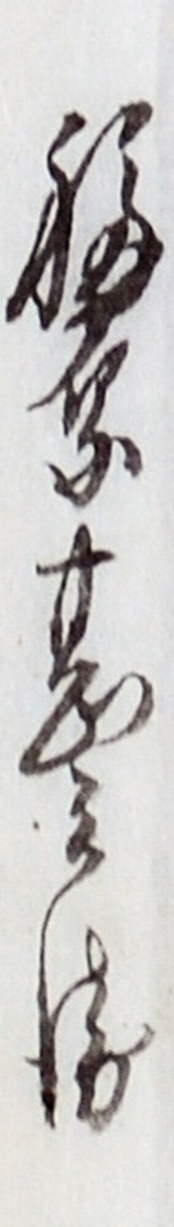福原甚兵衛
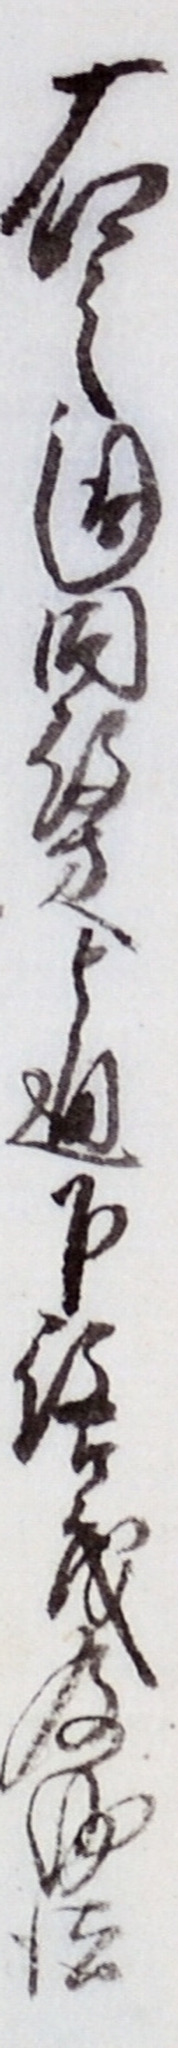右之趣同役方申通下役ケも及沙汰
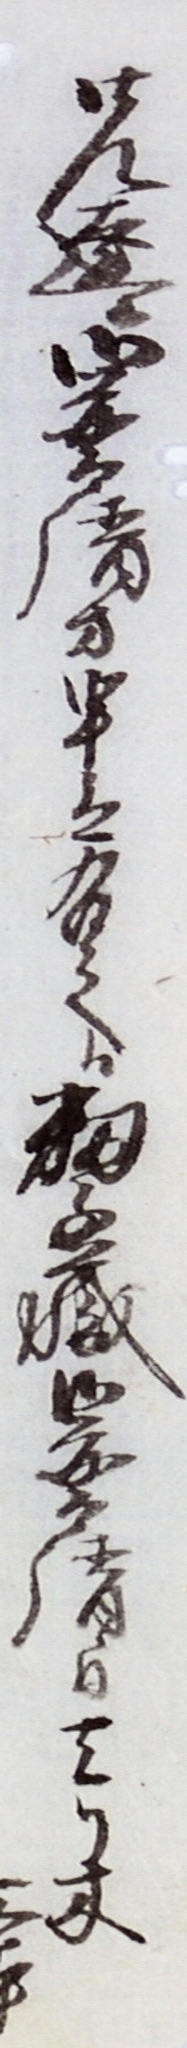一先達而御普請方申上有之も籾子蔵御普請ニ付はり木三本
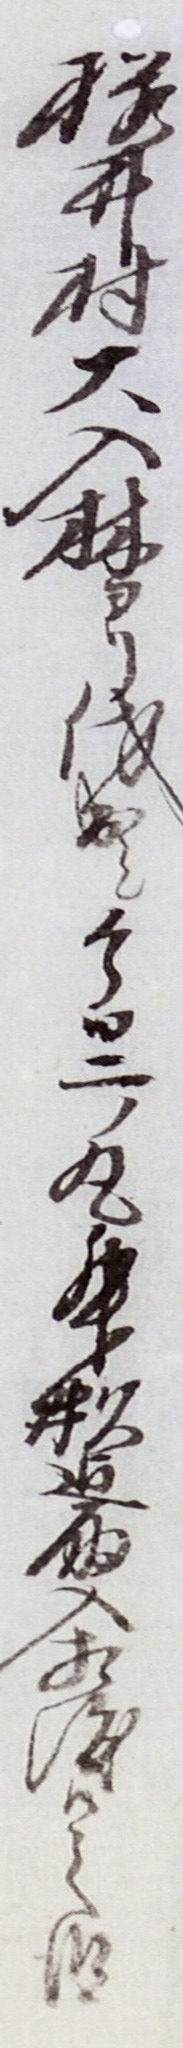桜井村大入林ヨリ伐出し今日二ノ丸升形迄取入相渡候様
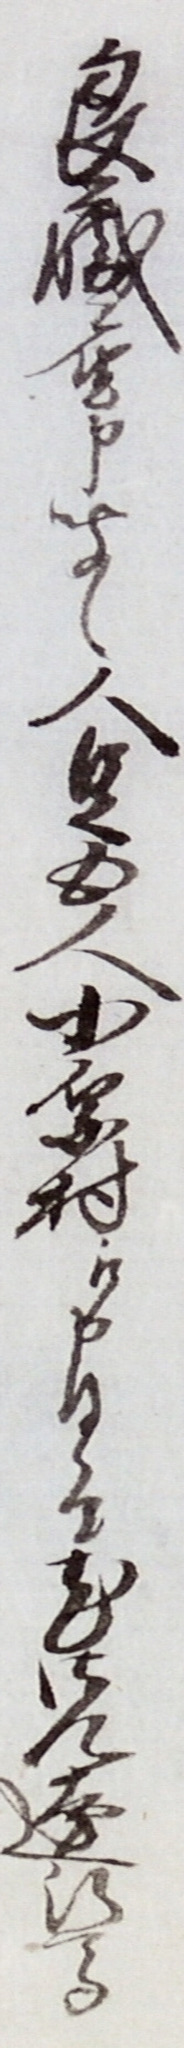良蔵届申聞候人足五人小原村江申付候尤先遂行高
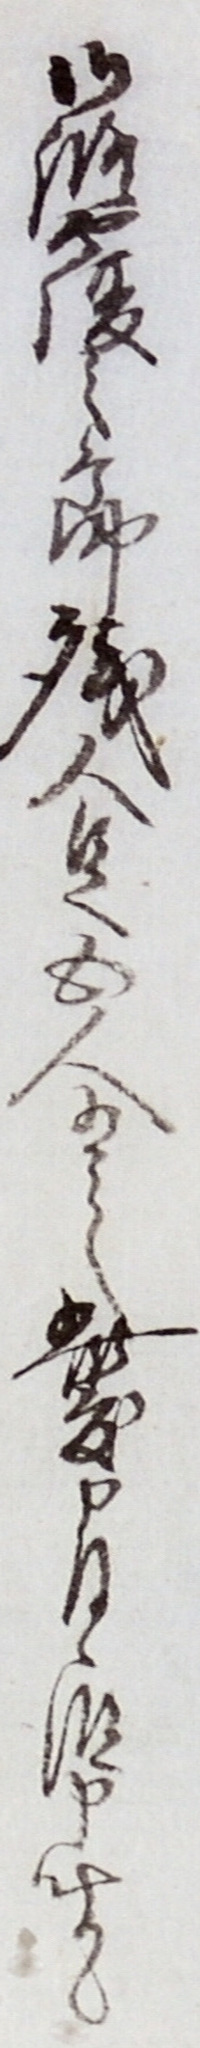御修復之節残人足五人有之候此度申付候段申聞候
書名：御山奉行御用控
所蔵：伊那市立高遠町図書館・合同会社AMANE
